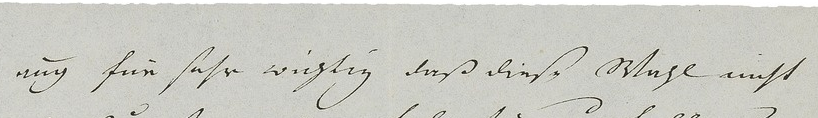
auch für sehr wichtig daß diese Wahl nicht
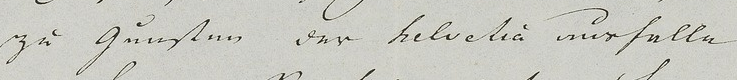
zu Gunsten der Helvetia ausfalle
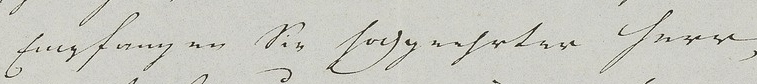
Empfangen Sie hochgeachteter Herr,
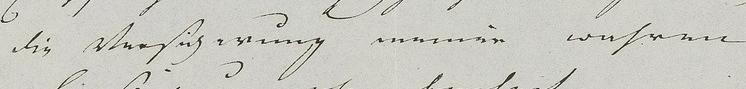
die Versicherung meiner wahren
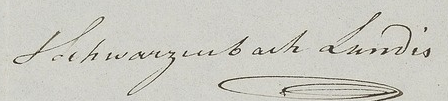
J Schwarzenbach Landis
